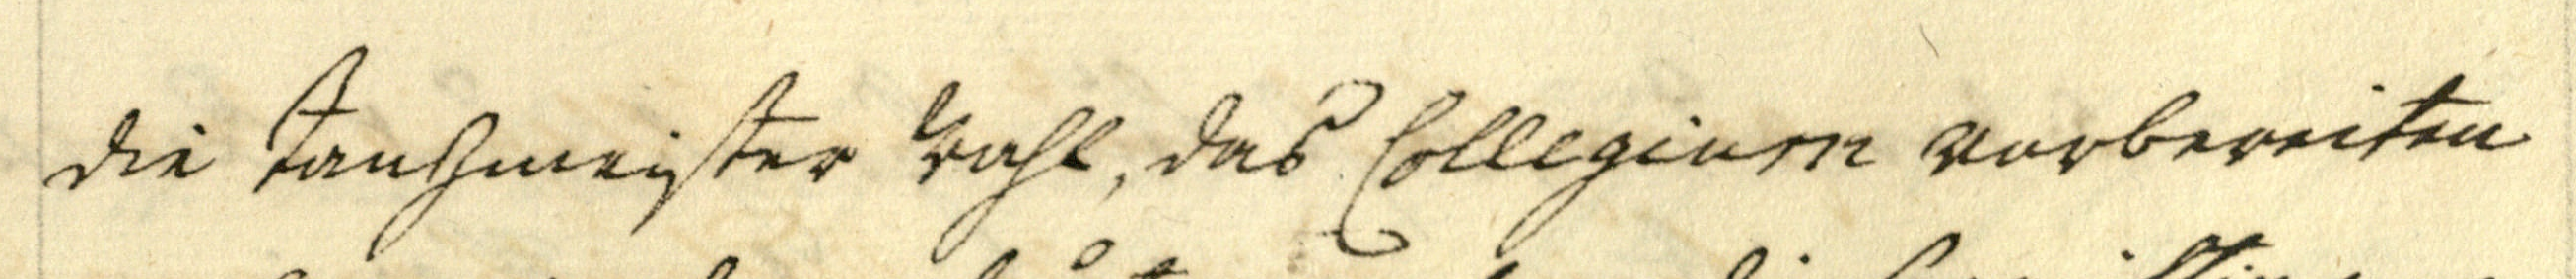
die Tanzmeister Wahl, das Collegium vorbereiten
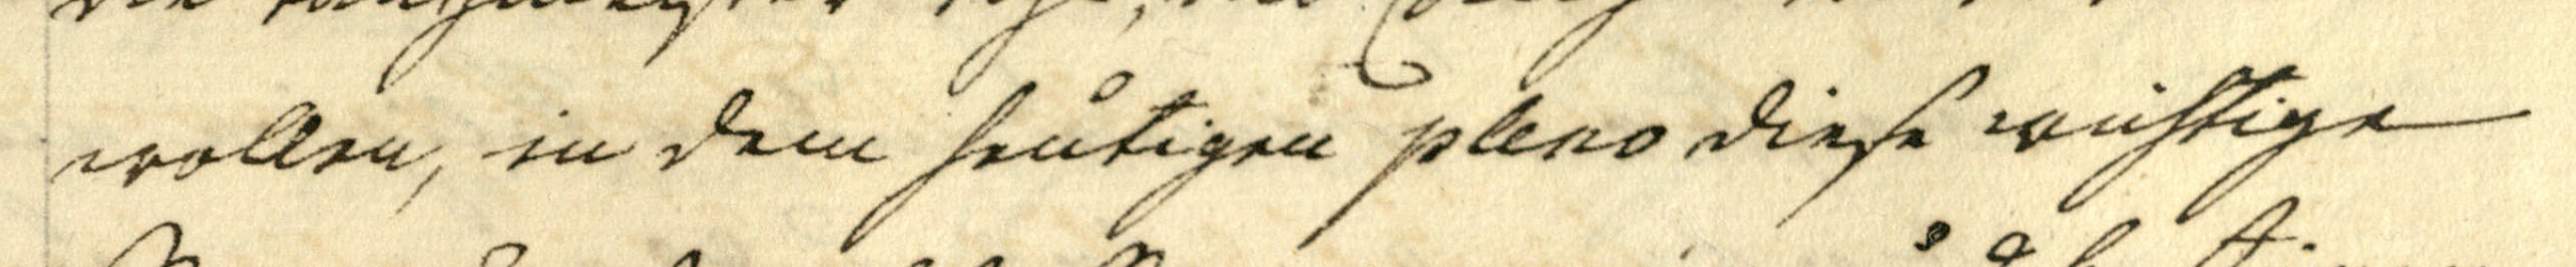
wollen, in dem heutigen pleno diese wichtige
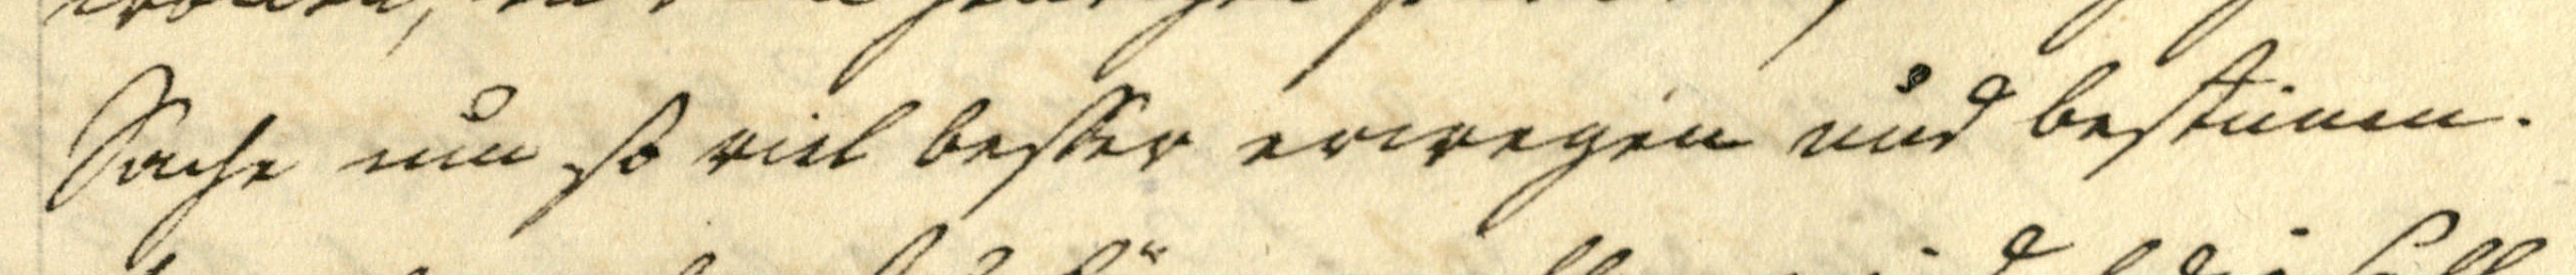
Sache um so viel besser erwegen und bestimm¬
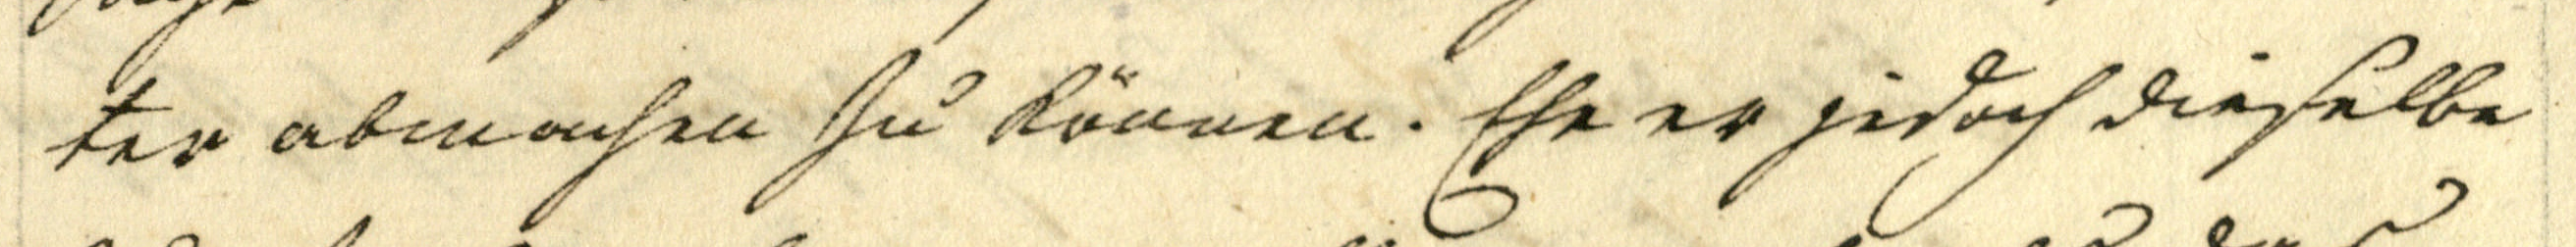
ter abmachen zu können. Ehe er jedoch dieselbe
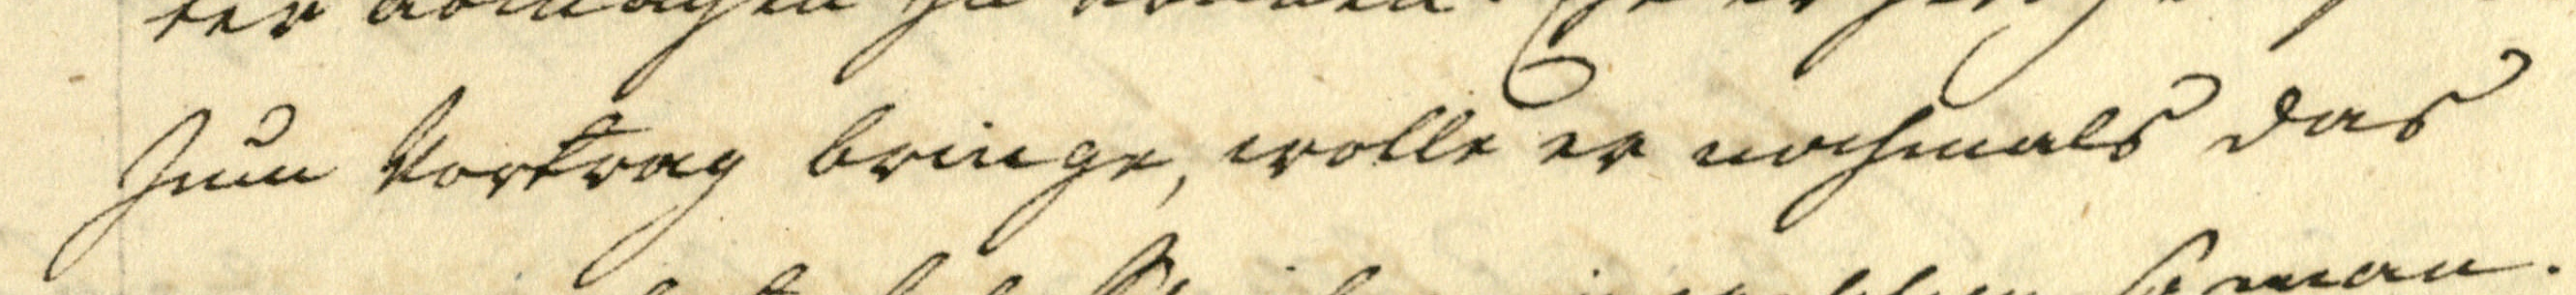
zum Vortrag bringe, wolle er nochmals das
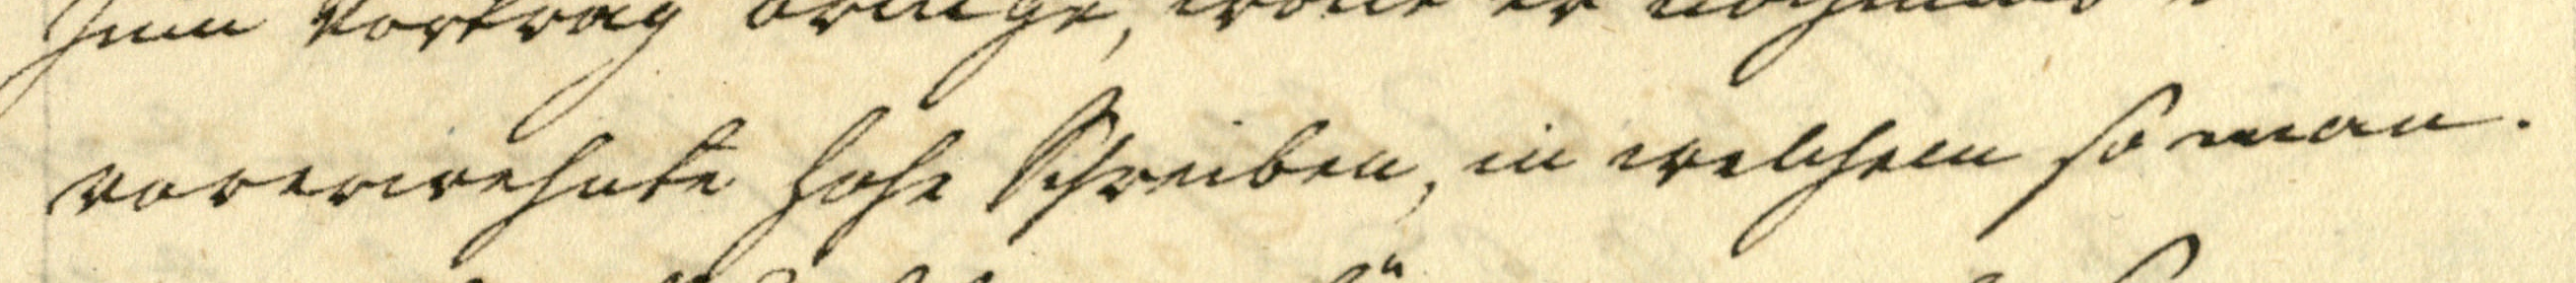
vorerwehnte hohe Schreiben, in welchem so man¬
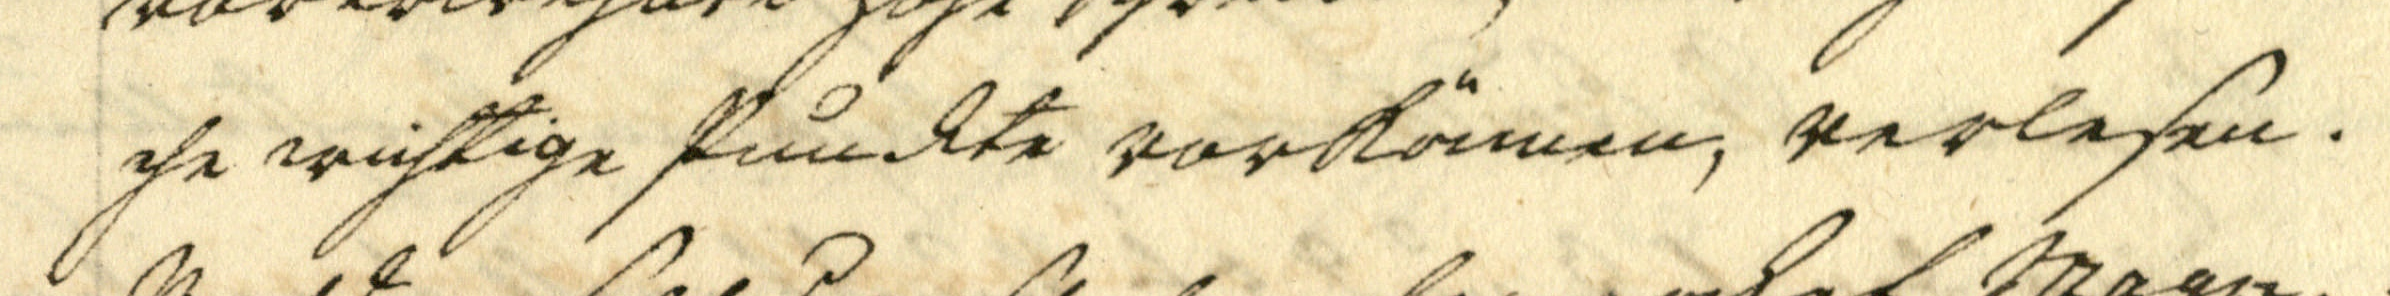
che wichtige Punckte vorkämen, verlesen.
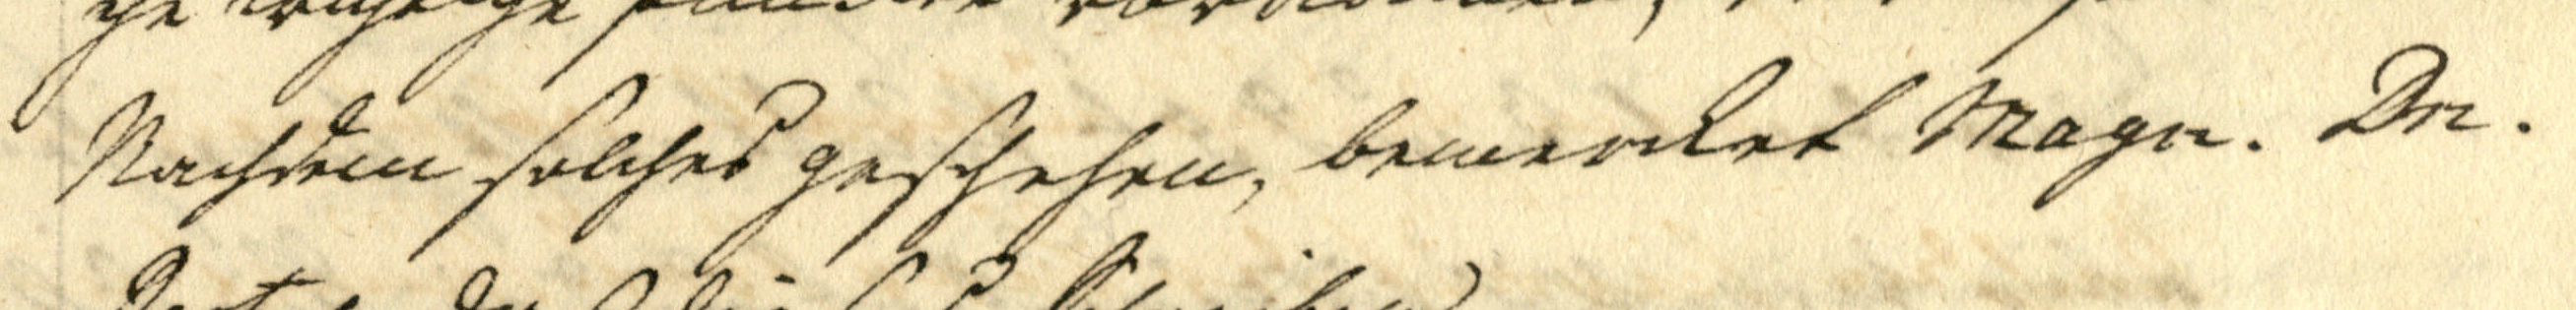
Nachdem solches geschehen, bemercket Magn. Dn.
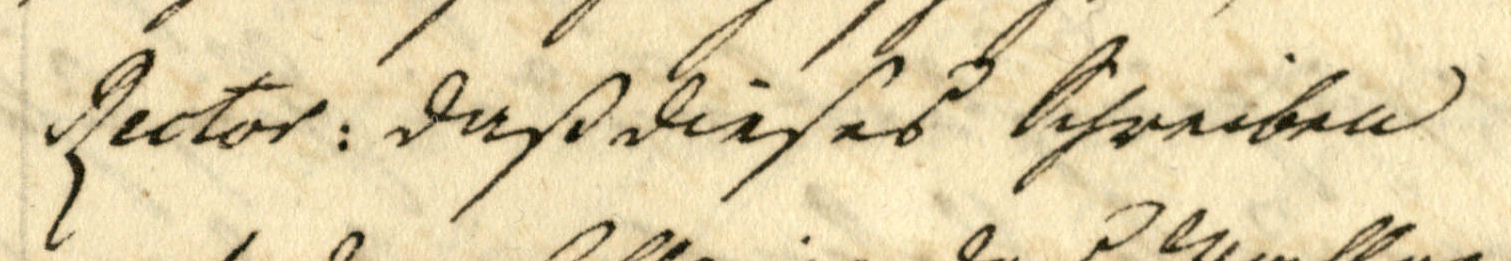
Rector: daß dieses Schreiben
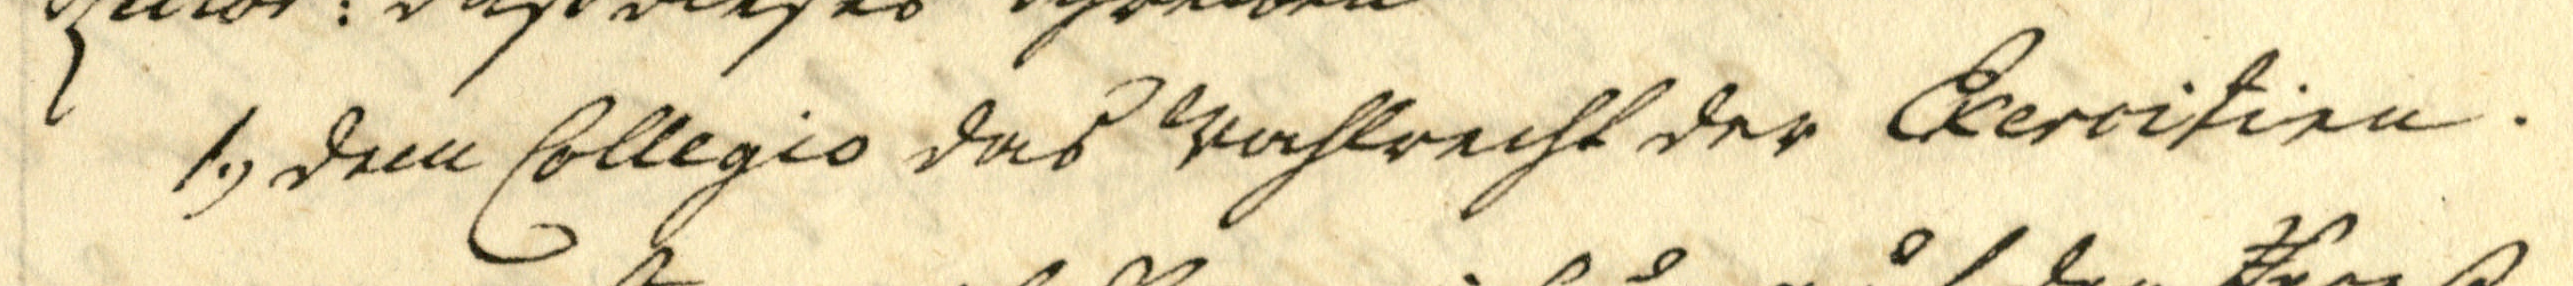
1., dem Collegio das Wahlrecht der Exercitien¬
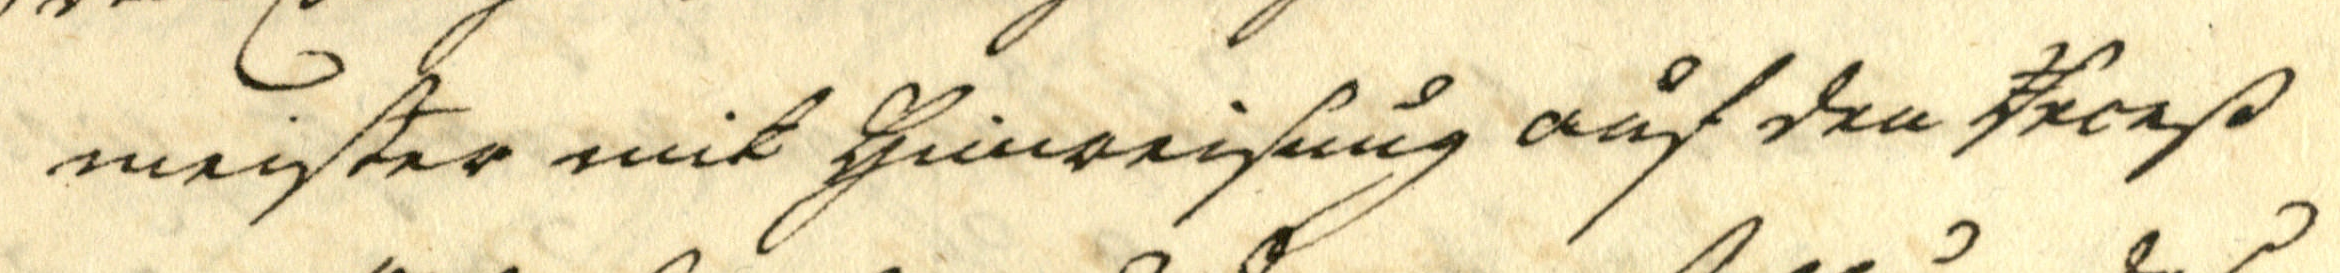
meister mit Hinweisung auf den Receß
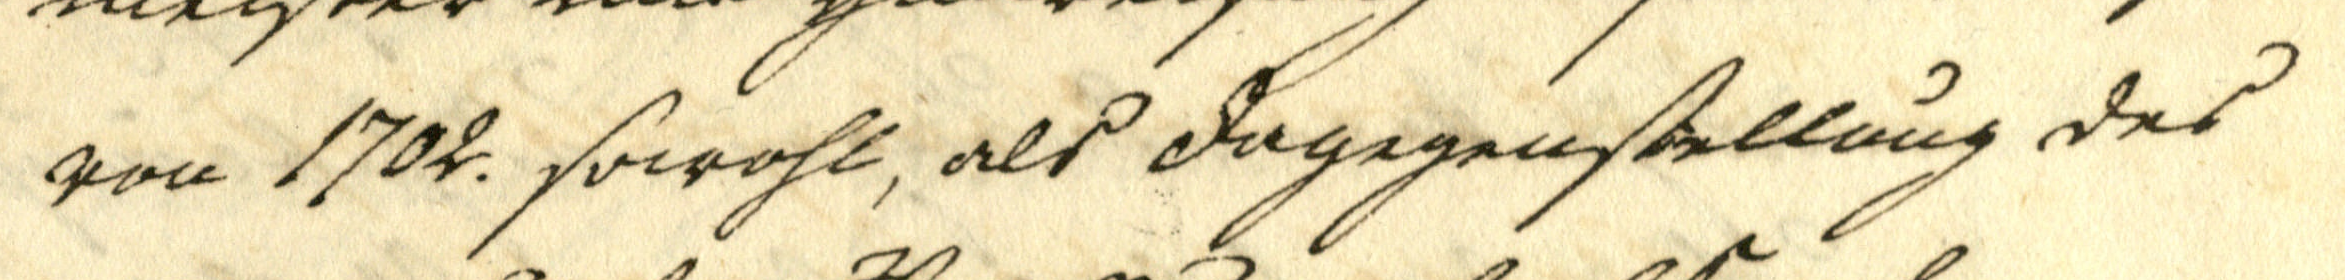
von 1702. sowohl, als Dagegenstellung des
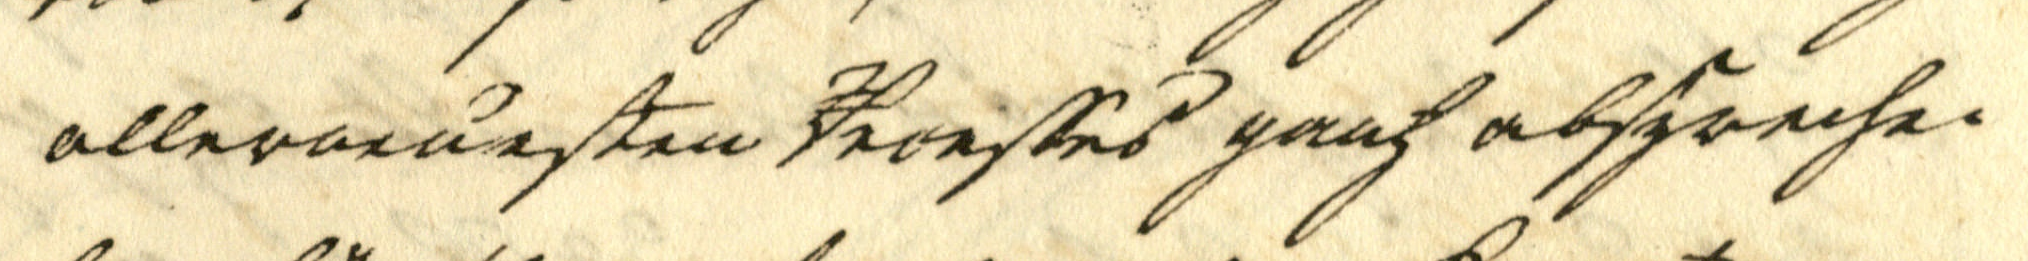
allerneuesten Recesses ganz abspreche.
